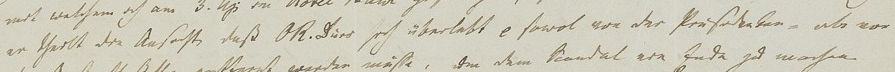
er theilt die Ansicht, daß OR. Dürr sich überlebt & sowol von der Präsidenten- als von
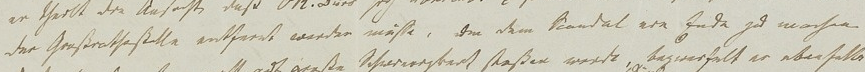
der Großrathsstelle entfernt werden müsse, um dem Scandal ein Ende zu machen.
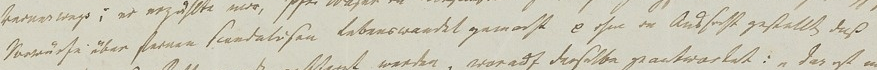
Vorwürfe über seinen scandalösen Lebenswandel gemacht & ihm in Aussicht gestellt, daß
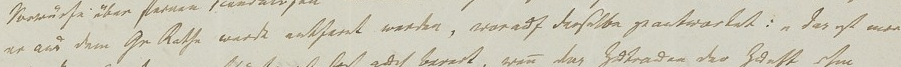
er aus dem Gr Rathe werde entfernt werden, worauf derselbe geantwortet: «Das ist mir
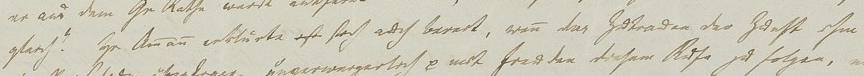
gleich.» Hr Ammann erklärte sich auch bereit, wenn das Zutrauen der Zunft ihm
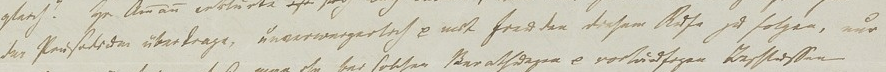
das Präsidium übertrage, unverweigerlich & mit Freuden diesem Rufe zu folgen, nur
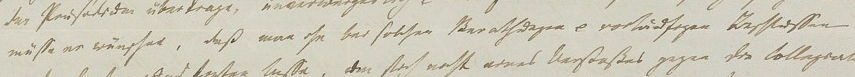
müsse er wünschen, daß man ihn bei solchen Berathungen & vorläufigen Beschlüssen
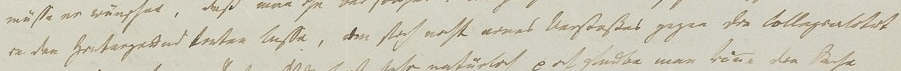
in den Hintergrund treten lasse, um sich nicht eines Verstoßes gegen die Collegialität
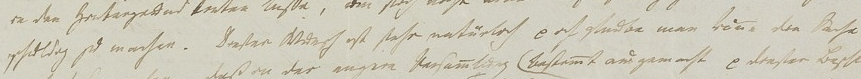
schuldig zu machen. Dieser Wunsch ist sehr natürlich & ich glaube man könne die Sache
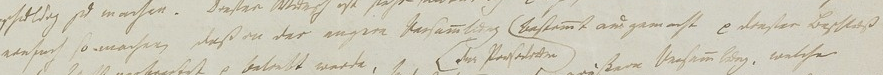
einfach so machen, daß in der engern Versammlung das Präsidium bestimmt ausgemacht & dieser Beschluß
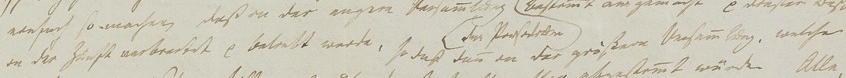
in der Zunft verbreitet & beliebt werde, so daß dann in der größern Versammlung, welche
